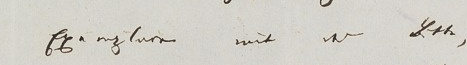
Exemplare mit der Bitte,
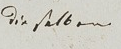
dieselben
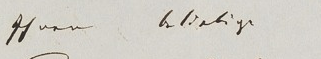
Ihnen beliebige
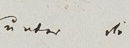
unter die
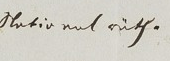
Nationalräthe zu
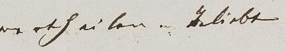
vertheilen. Beliebt
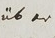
es Ihnen,
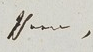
den
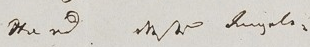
Stand dieser Angele-
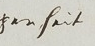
genheit
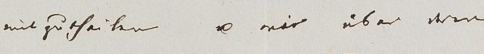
mitzutheilen & mir über deren
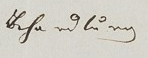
Behandlung
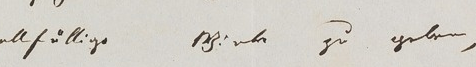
allfällige Winke zu geben,
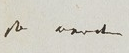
so werden
